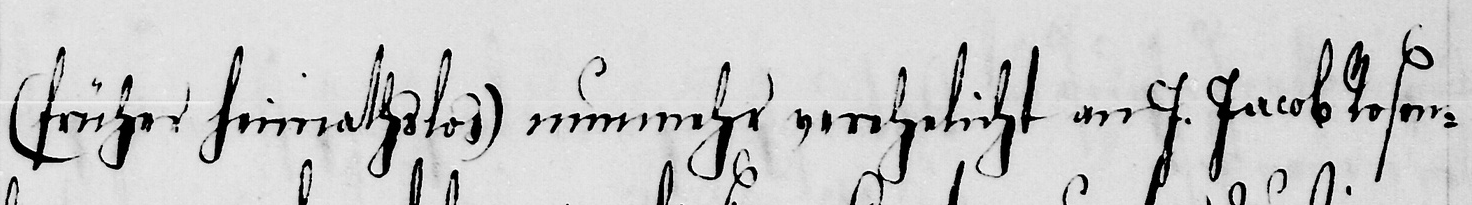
(früher heimathlos) nunmehr verehelicht an J. Jacob Rosen¬
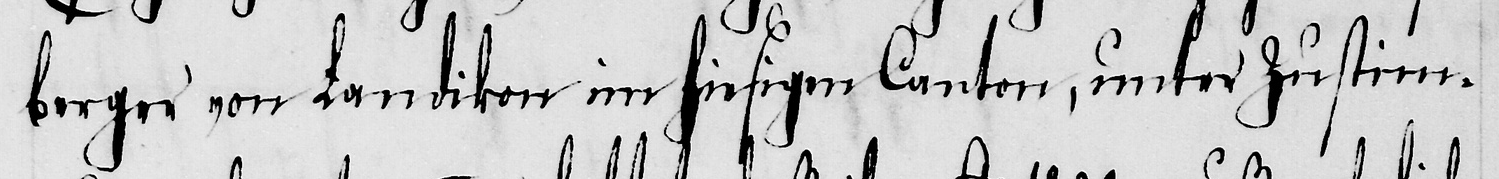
berger von Landikon im hiesigen Canton, unter Zustim¬
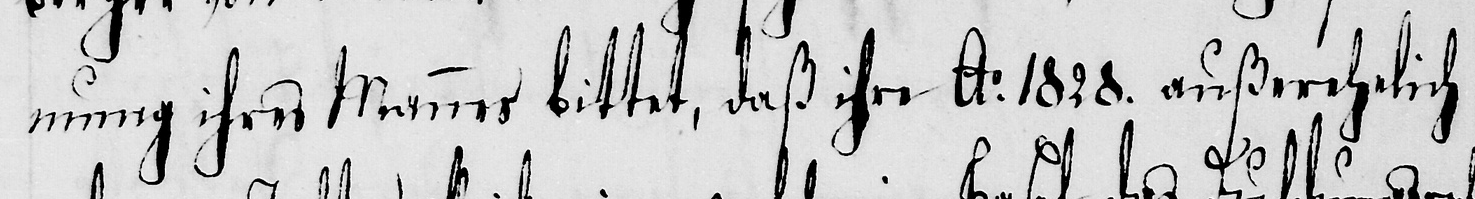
mung ihres Mannes bittet, daß ihre Ao. 1828. außerehelich
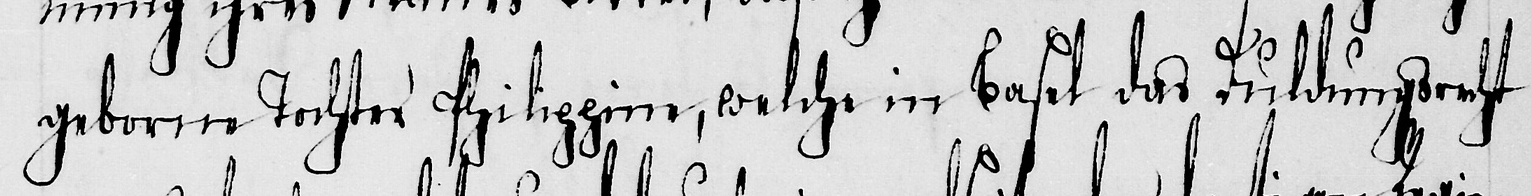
geborne Tochter Philippina, welche in Basel das Duldungsrecht
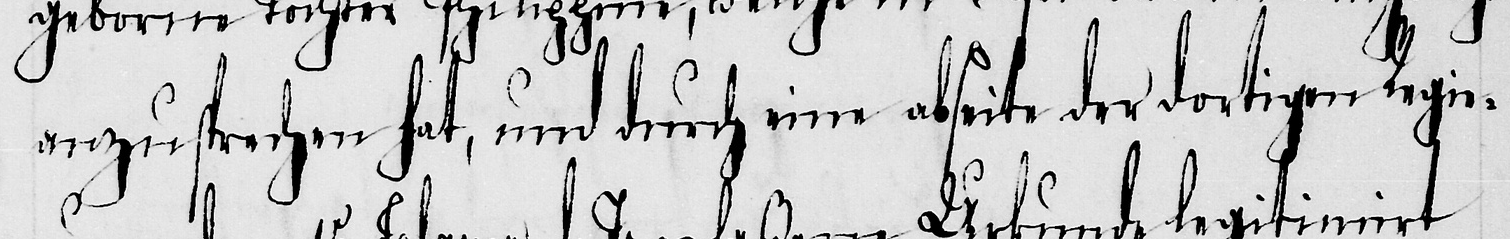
anzusprechen hat, und durch eine abseite der dortigen
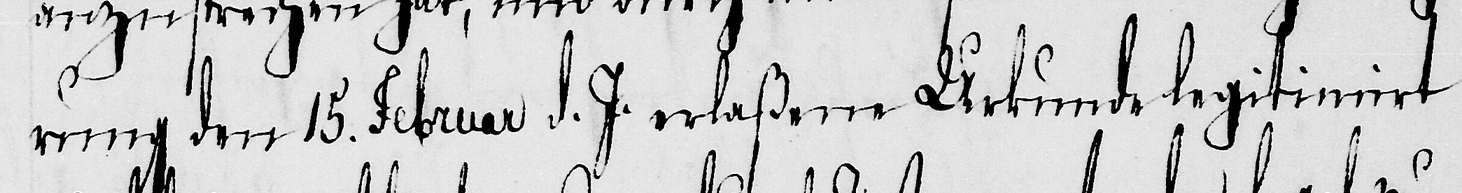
erung den 15. Februar d. J. erlaßenen Urkunde legitimirt
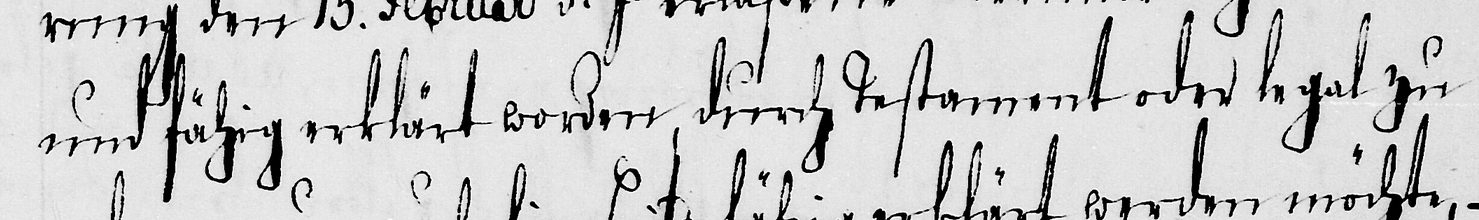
und fähig erklärt worden, durch Testament oder legal zu
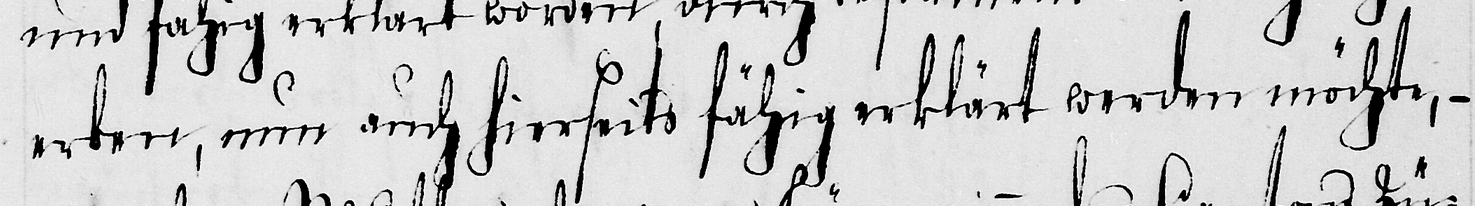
erben, nun auch hierseits fähig erklärt werden möchte,
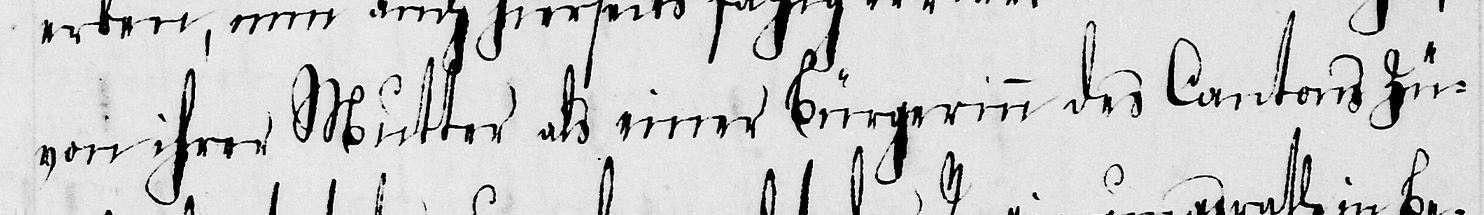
von ihrer Mutter als einer Bürgerinn des Cantons Zü¬
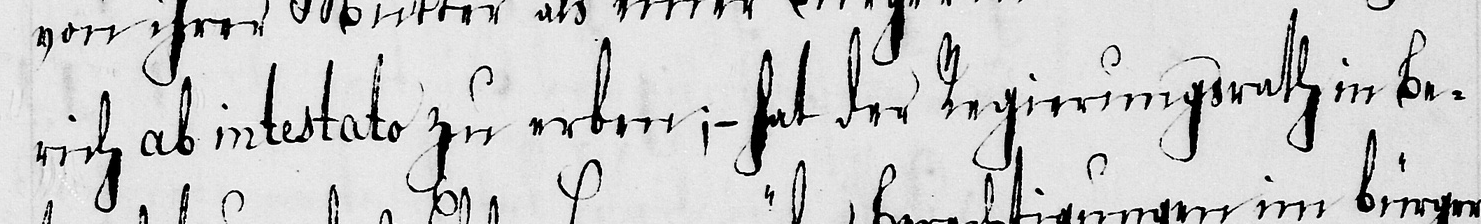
rich ab intestato zu erben; – hat der Regierungsrath in Be¬
